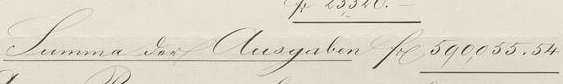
Summa der Ausgaben fr 590,055.54
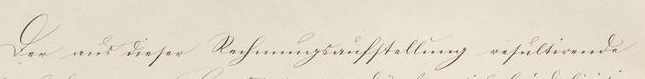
Der aus dieser Rechnungsaufstellung resultirende
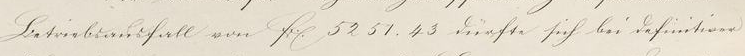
Betriebsausfall von fr. 5251.43 dürfte sich bei definitiver
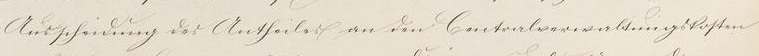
Ausscheidung des Antheiles an den Centralverwaltungskosten
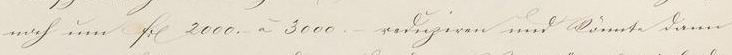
noch um fr 2000.– à 3000.– reduziren und könnte dann
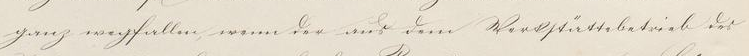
ganz wegfallen, wenn der aus dem Werkstättebetrieb des
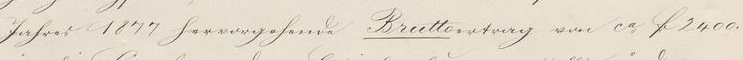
Jahres 1877 hervorgehende Bruttoertrag von ca fr 2400.–
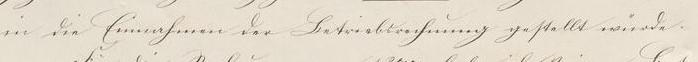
in die Einnahmen der Betriebsrechnung gestellt würde.
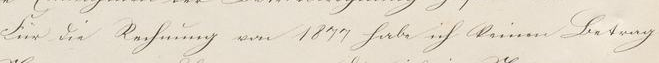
Für die Rechnung von 1877 habe ich keinen Betrag
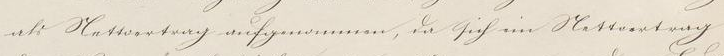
als Nettoertrag aufgenommen, da sich ein Nettoertrag
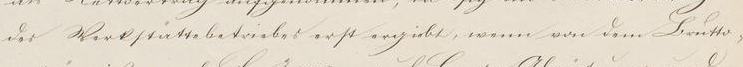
des Werkstättebetriebes erst ergiebt, wenn von dem Brutto-
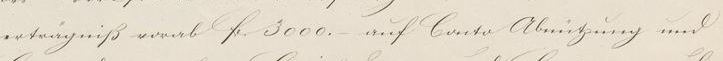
erträgniß vorab fr. 3000.– auf Conto Abnützung und
